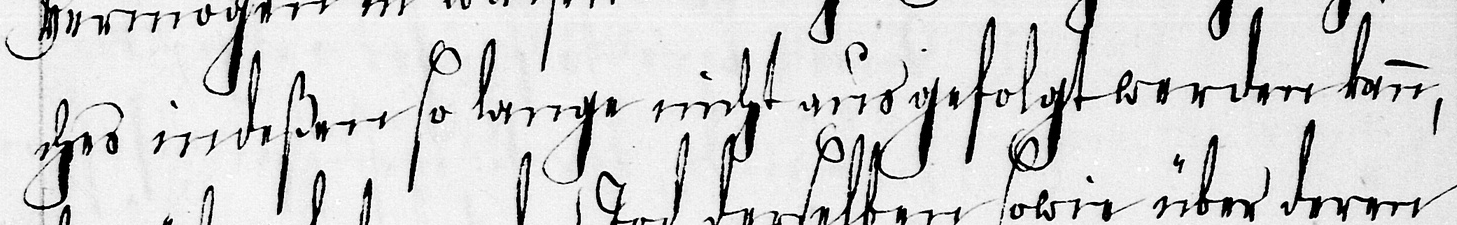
ches indeßen so lange nicht ausgefolgt werden kann,
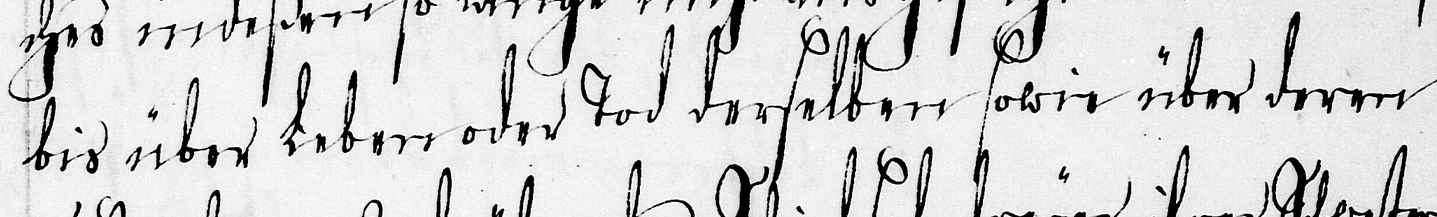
bis über Leben und Tod derselben sowie über deren
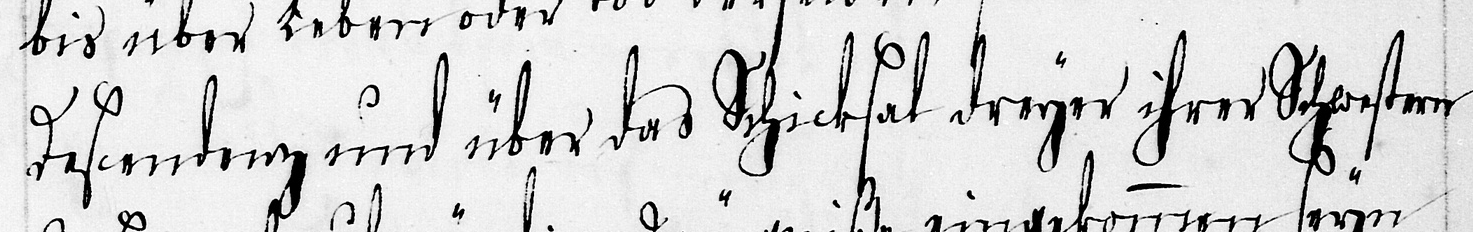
Descendenz und über das Schicksal dreyer ihrer
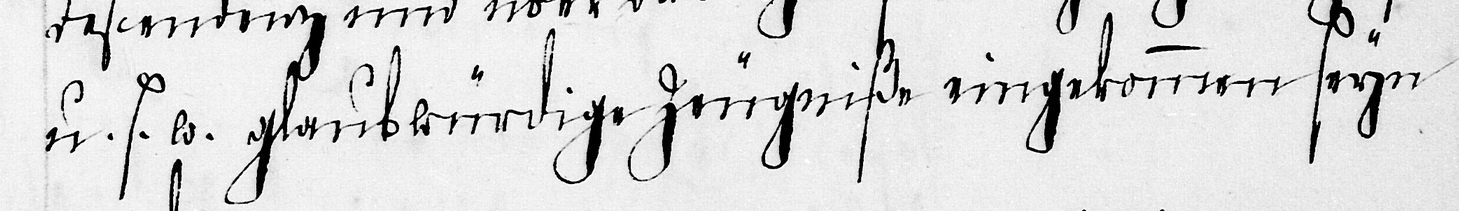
u. s. w. glaubwürdige Zeugniße eingekommen seyn
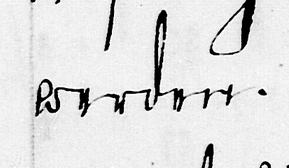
werden.
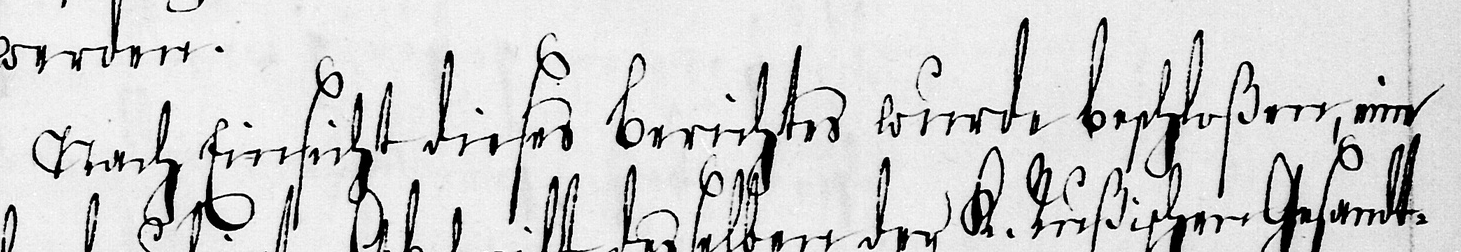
Nach Einsicht dieses Berichtes wurde beschloßen, eine
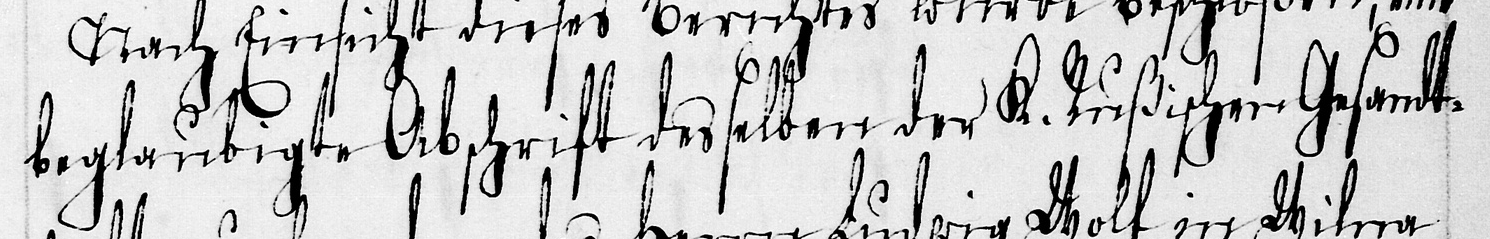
beglaubigte Abschrift desselben der K. Rußischen Gesandt¬
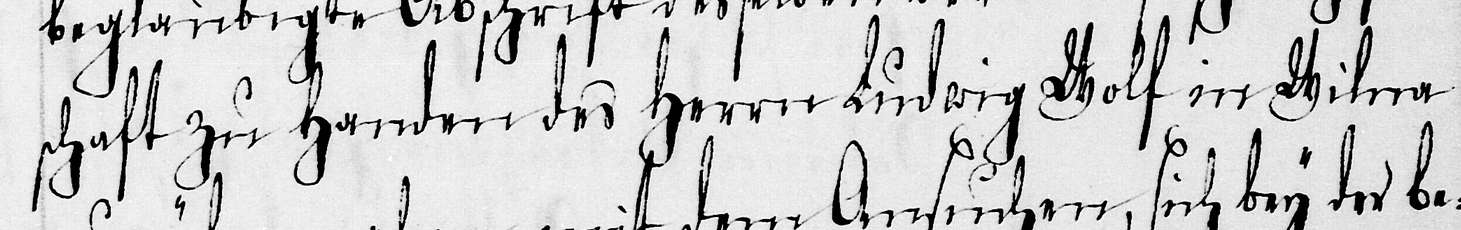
schaft zu Handen des Herrn Ludwig Wolf in Wilna
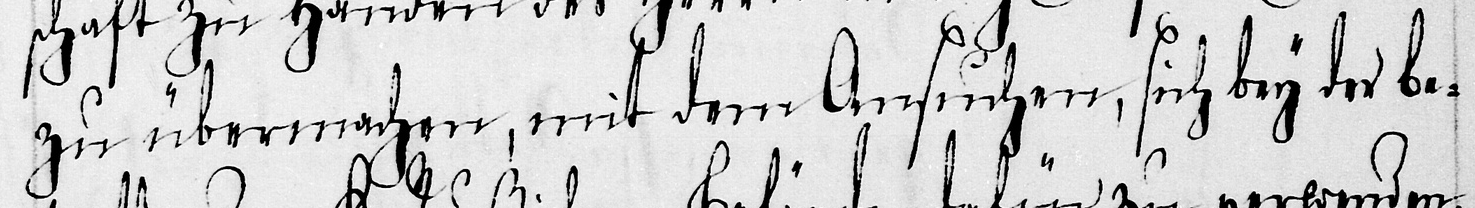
zu übermachen, mit dem Ansuchen, sich bey der be¬
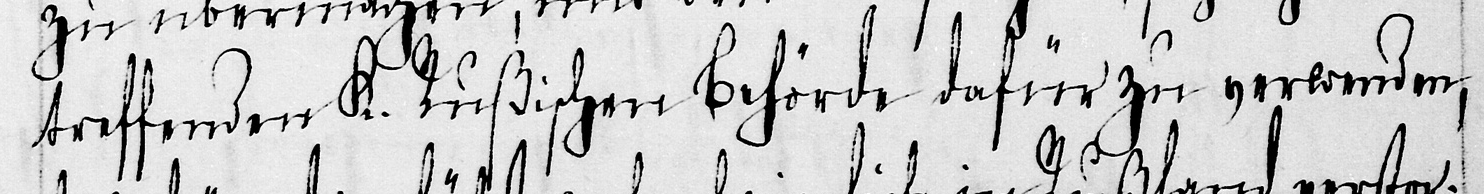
treffenden K. Rußischen Behörde dafür zu verwenden,
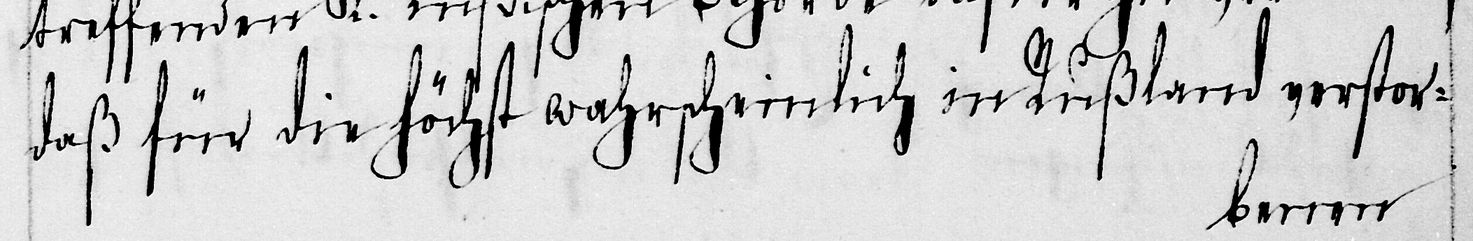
daß für die höchst wahrscheinlich in Rußland verstor-
